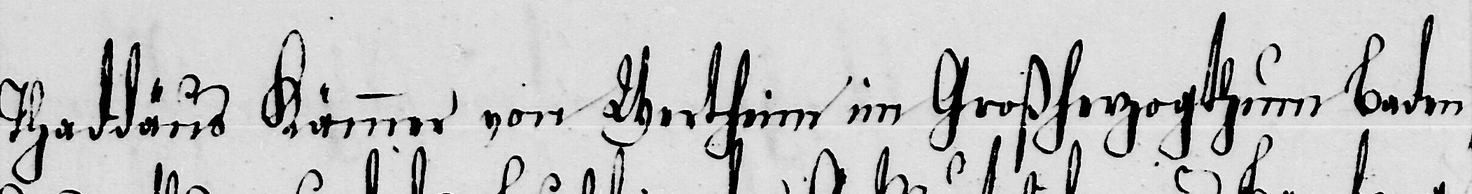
Thaddäus Kämmer von Wertheim im Großherzogthum Baden,
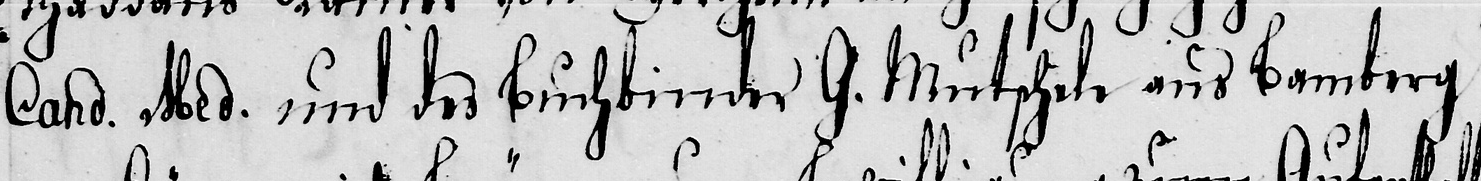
Cand. Med. und des Buchbinder G. Mutschele aus Bamberg
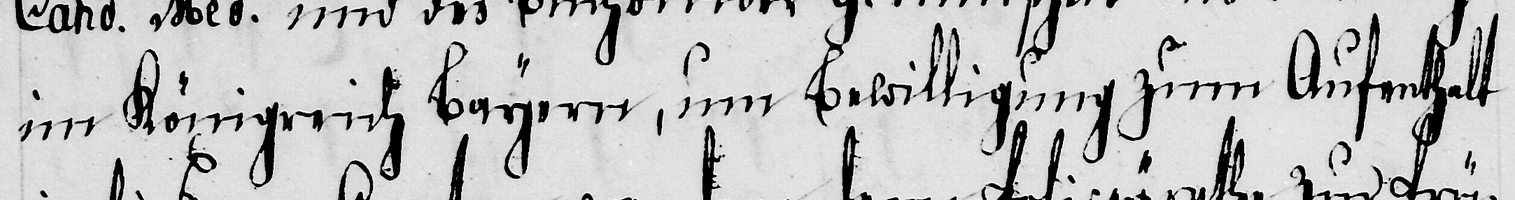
im Königreich Bayern, um Bewilligung zum Aufenthalt
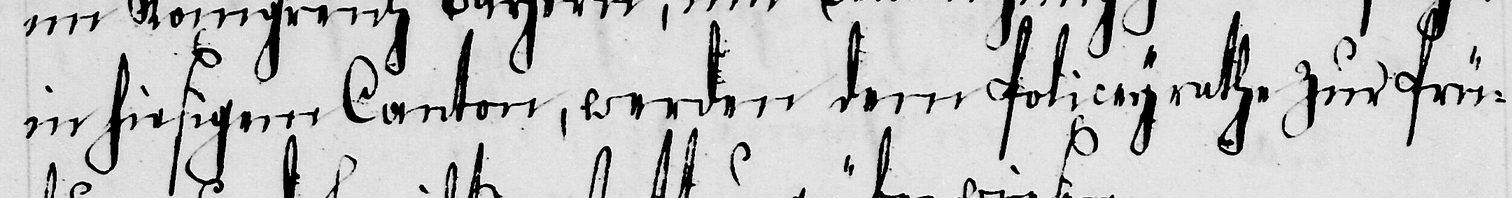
in hiesigem Canton, werden dem Policeyrathe zur Prü¬
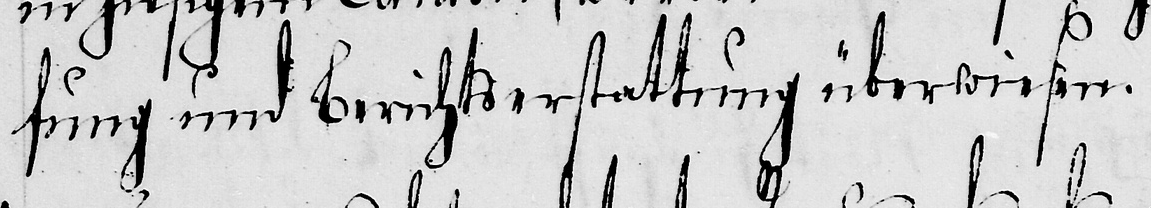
fung und Berichtserstattung überwiesen.
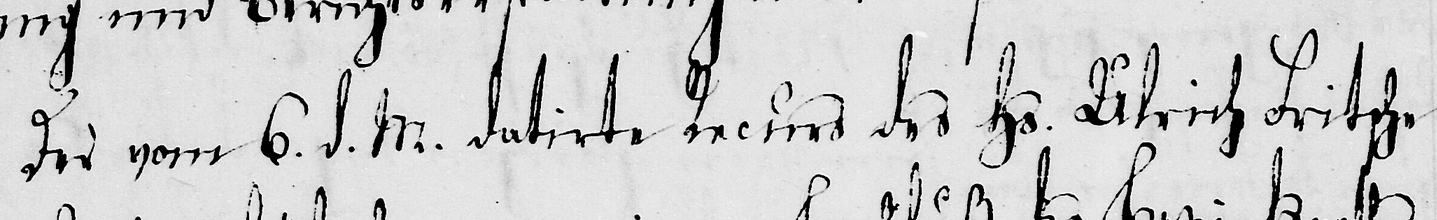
Der vom 6. d. M. datirte Recurs des Hs. Ulrich Fritsche
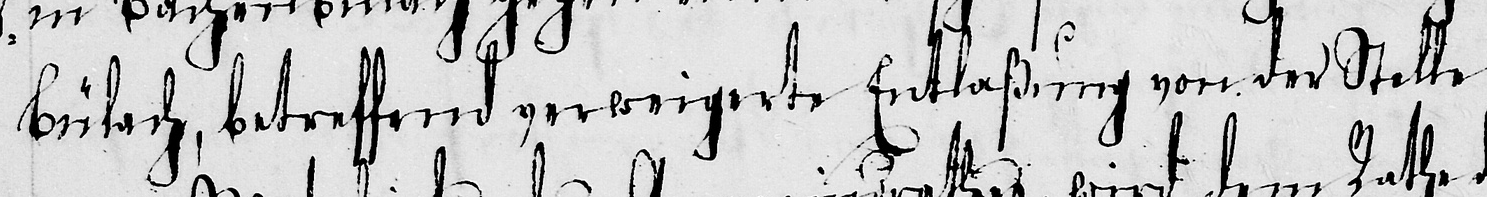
Bülach, betreffend verweigerte Entlaßung von der Stelle
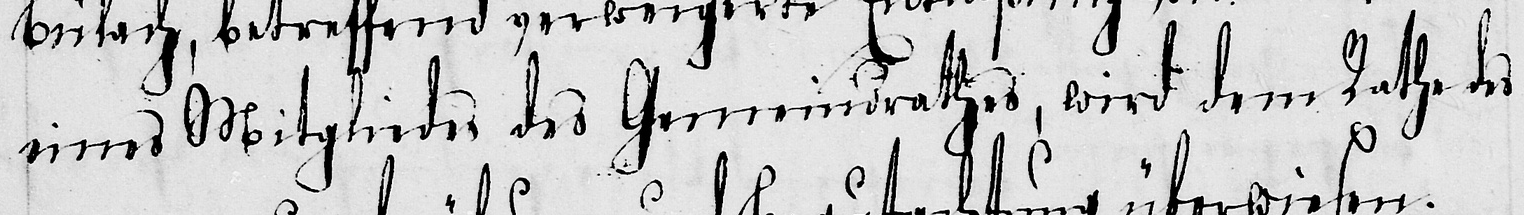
eines Mitgliedes des Gemeindrathes, wird dem Rathe des
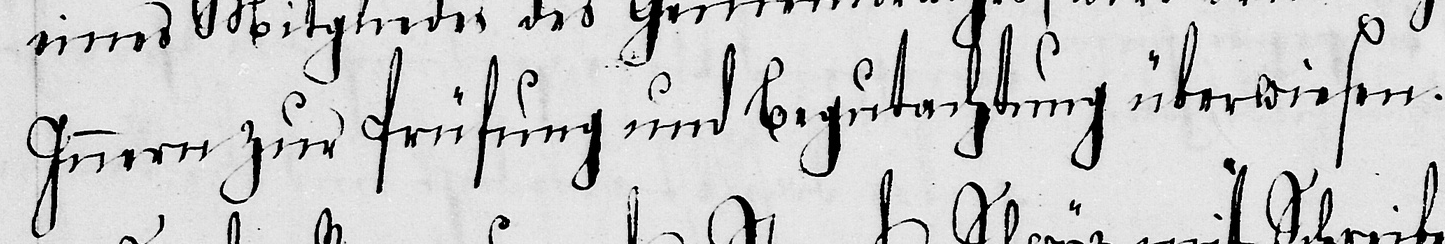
Innern zur Prüfung und Begutachtung überwiesen.
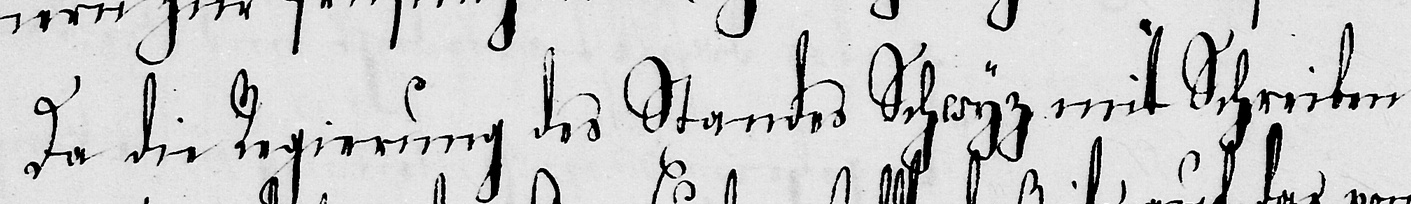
Da die Regierung des Standes Schwyz mit Schreiben
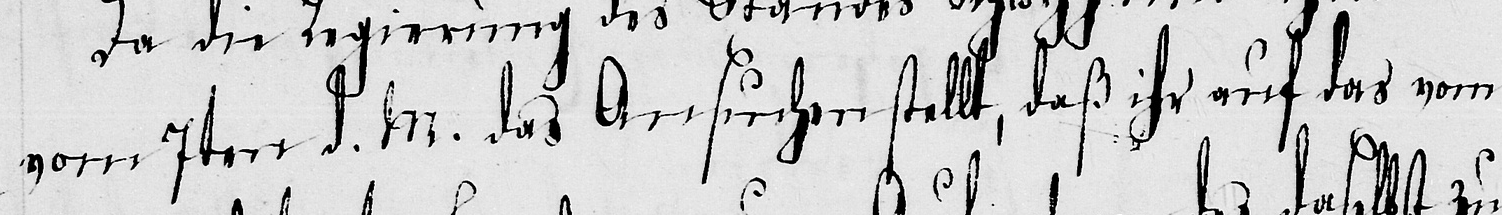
vom 7ten d. M. das Ansuchen stellt, daß ihr auf das vom
